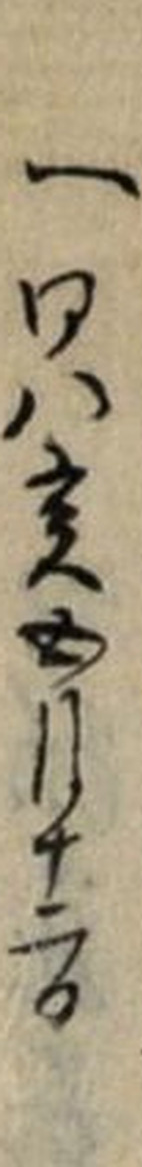一同八亥五月十二日
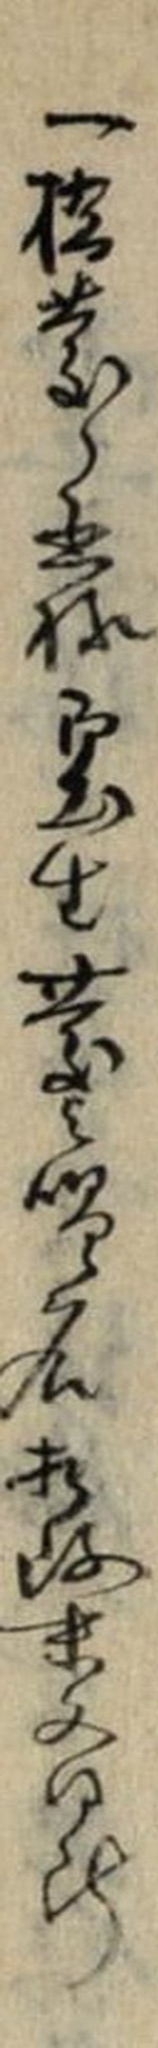一橋慶之丞様御出生慶と唱申名相改末文同断
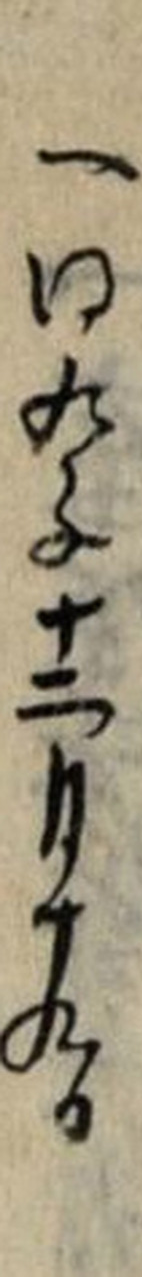一同九子十二月十九日
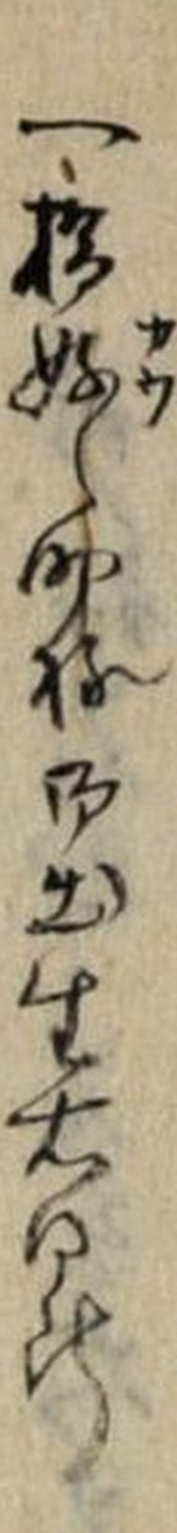一橋好之助様御出生右同断
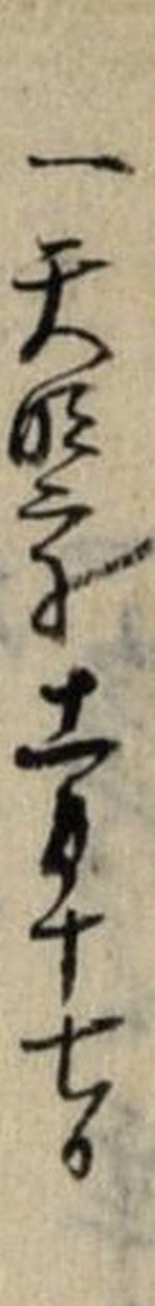一天明二寅十一月十七日
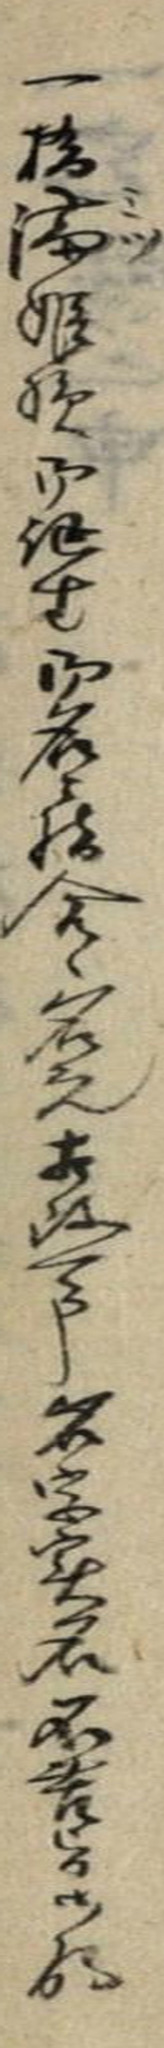一橋満姫様御誕生御名に指合候名元相改可申名字実名不苦旨御触
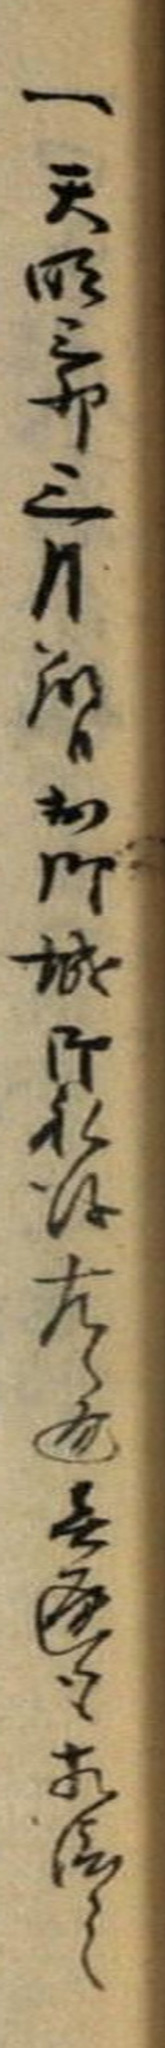一天明三卯三月朔日於御城御礼後左之通壱通つゝ相渡之
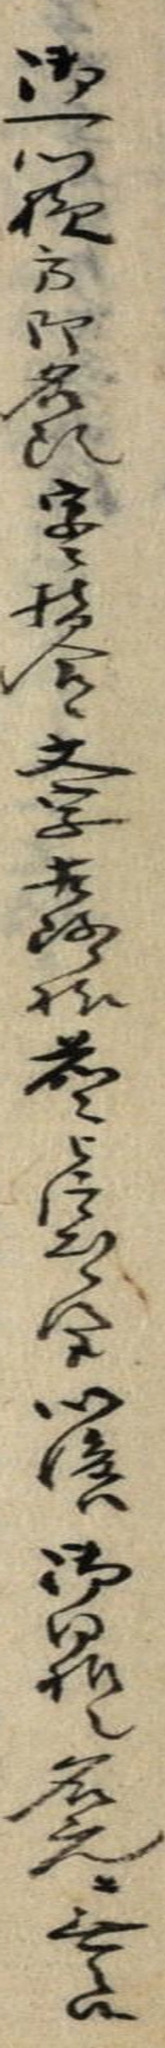御一門様方御名頭字に指合候文字相改候様前々被仰出候得共以後は御同様之名元に無之候
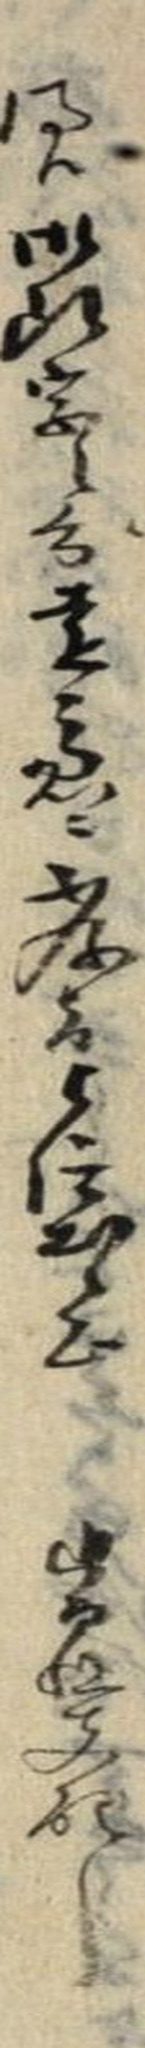得は御頭字之分遠慮に不及旨被仰出候以上追而組支配
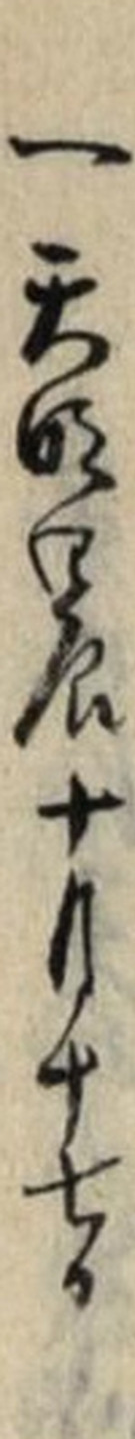一天明四辰十月十七日
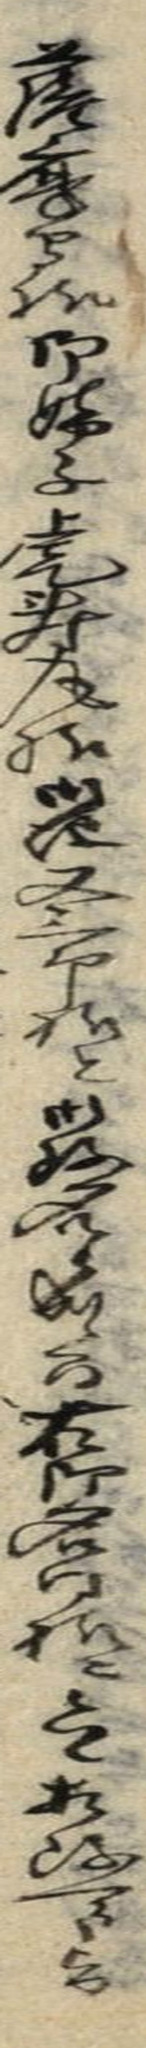薩摩守様御嫡子虎寿丸様御儀又三郎様と御改名被成候間右御名同様に候はゝ相改可申旨
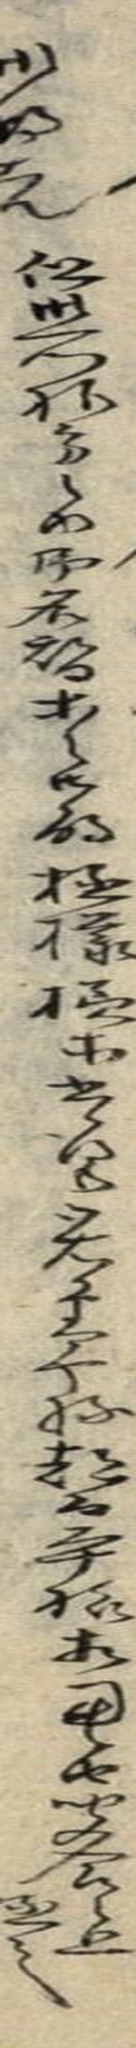御触出る但御一門様方之内御名替等之御触極様様等書候得共御右筆部や抔都而平様相用候由聞合候上極之
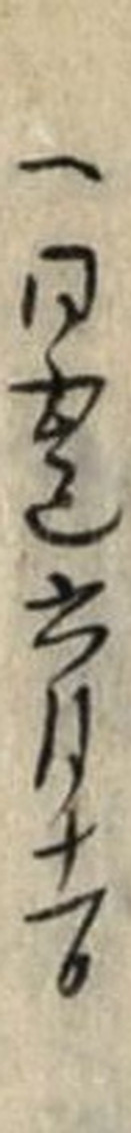一同五巳六月十一日
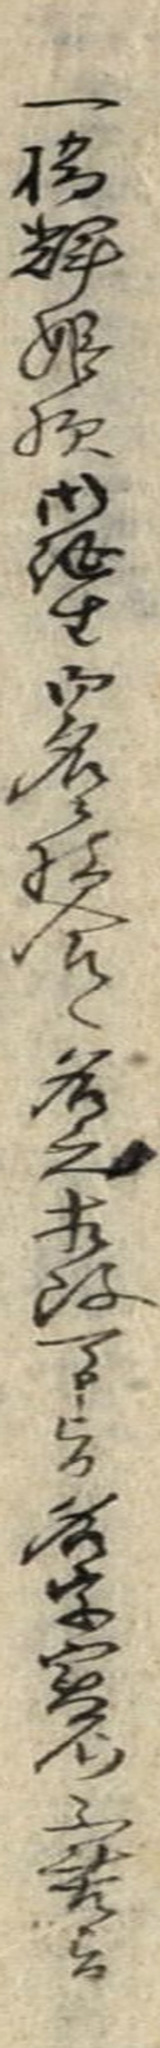一橋輝姫様御誕生御名指合候名元相改可申旨名字実名不苦旨
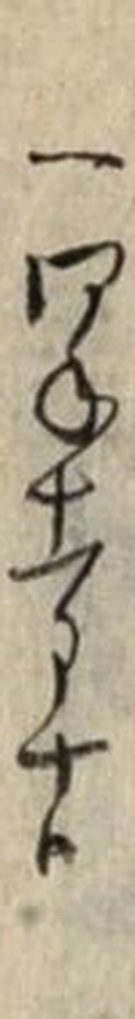一同年十一月十日
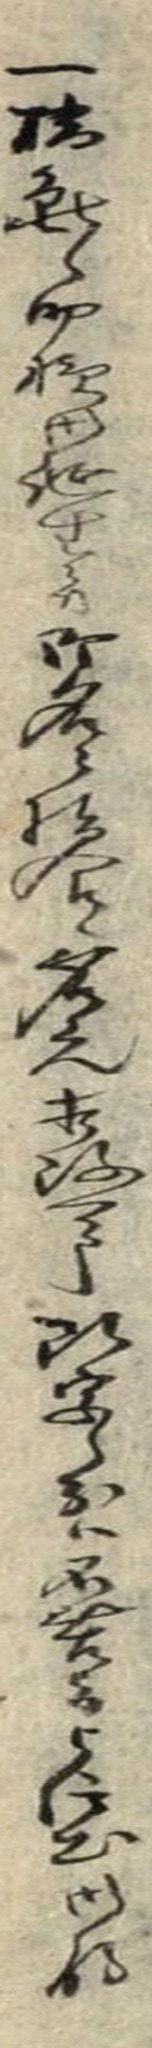一橋亀之助様御誕生に付御名に指合候名元相改可申頭字之分は不苦旨被仰出御触
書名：蒐輯之部
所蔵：福井県文書館 Fukui Prefectural Archives
